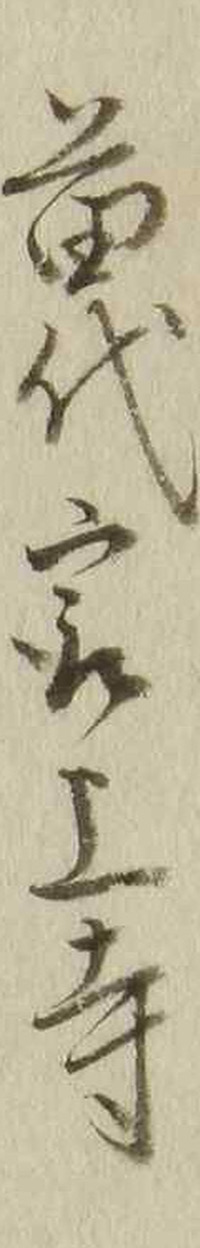苗代最上寺
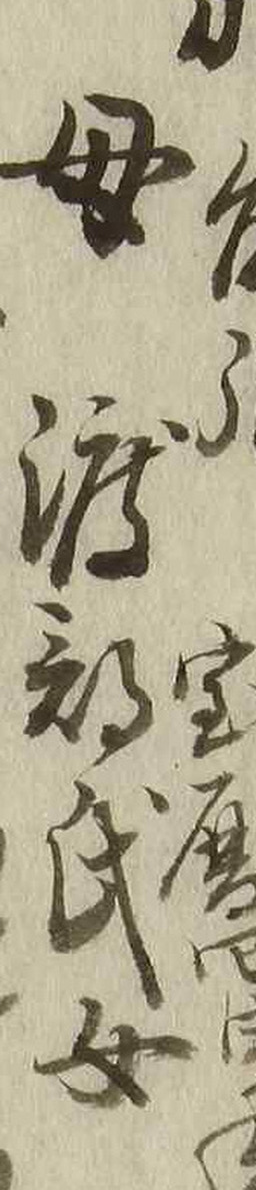母渡部氏女
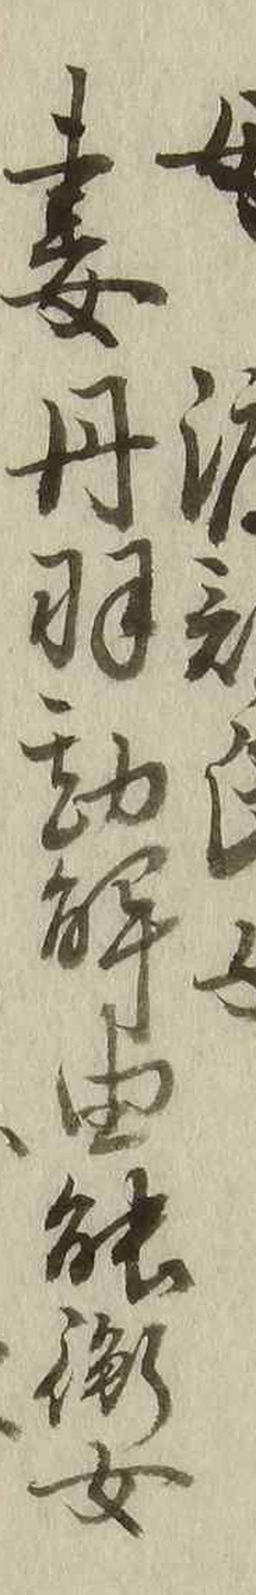妻丹羽勘解由能衒女
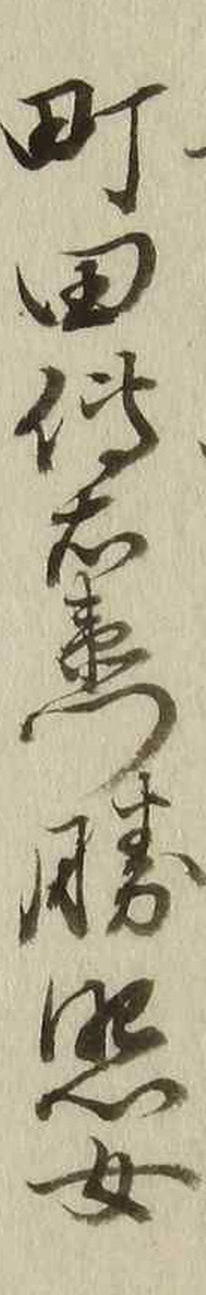町田伝右衛門勝照女
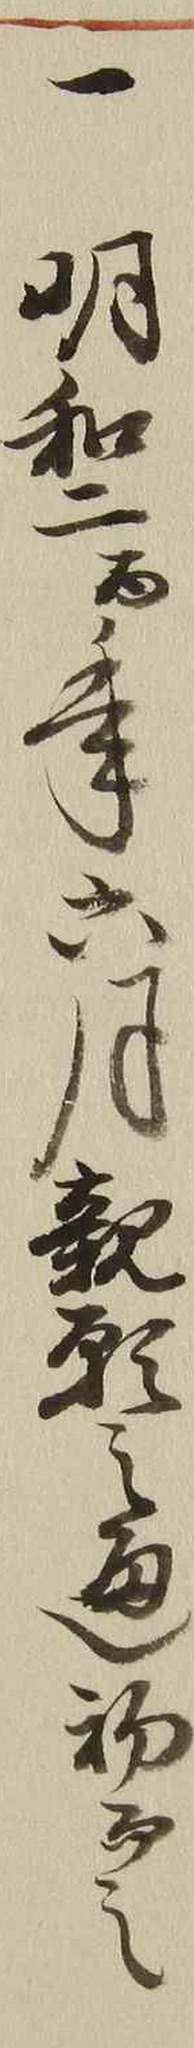一明和二酉年六月親願之通初而之
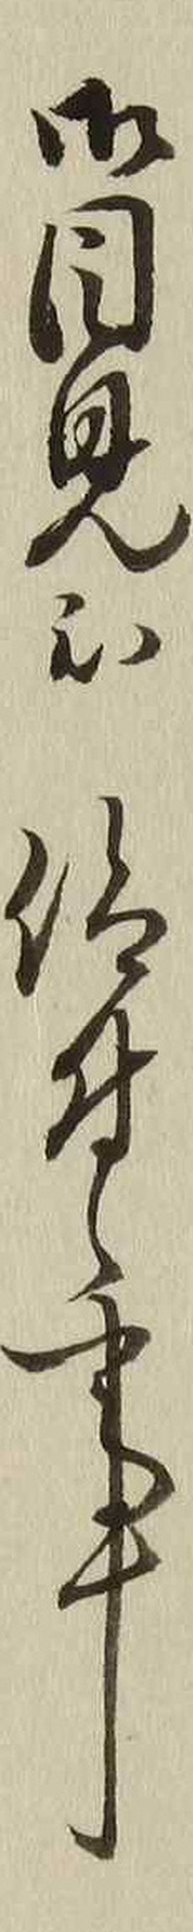御目見被仰付候事
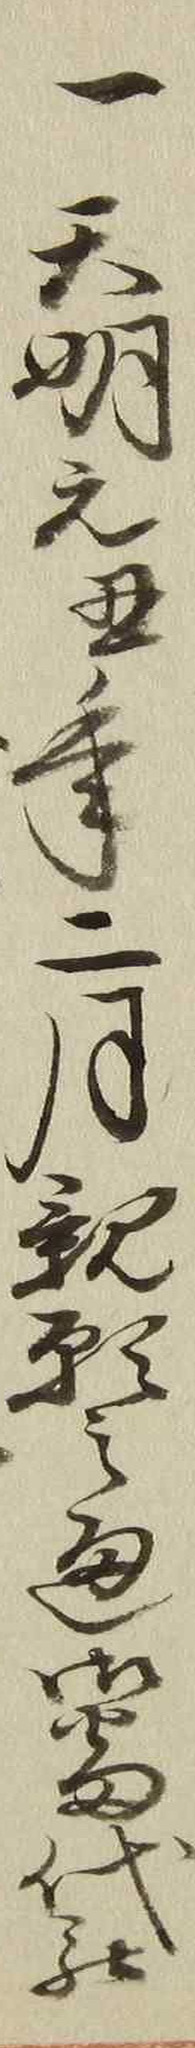一天明元丑年二月親願之通御番代被
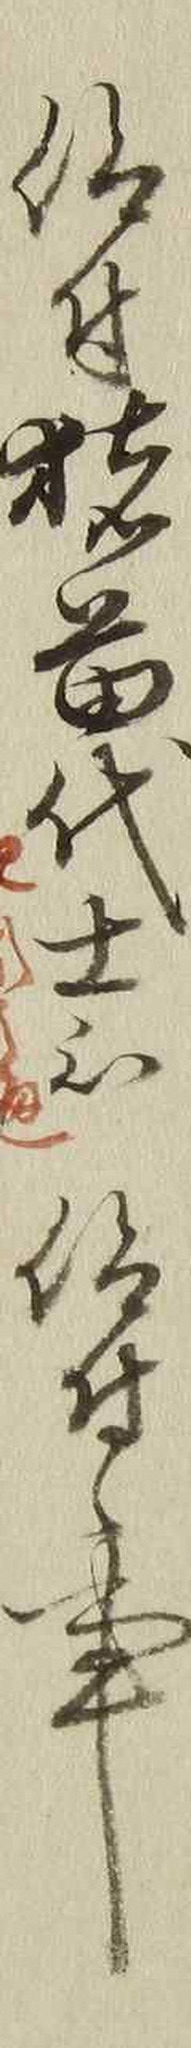仰付猪苗代士被仰付候事
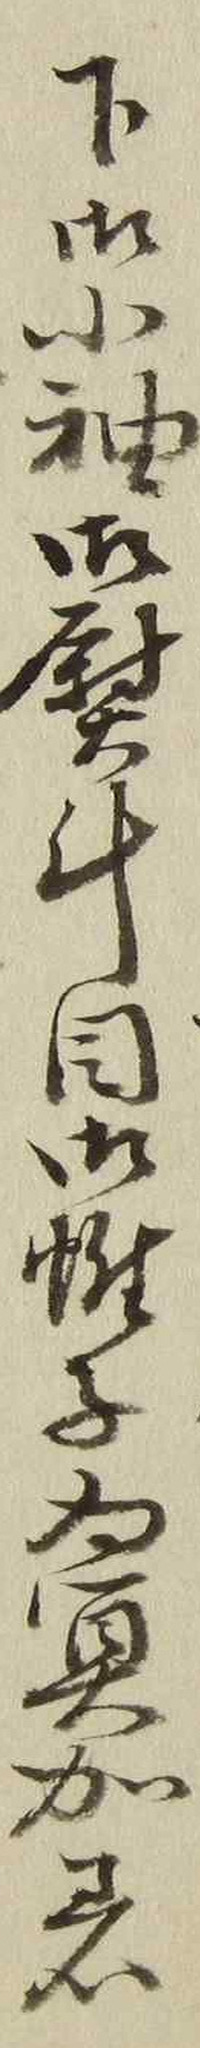下御小袖御熨斗目御帷子為冥加着
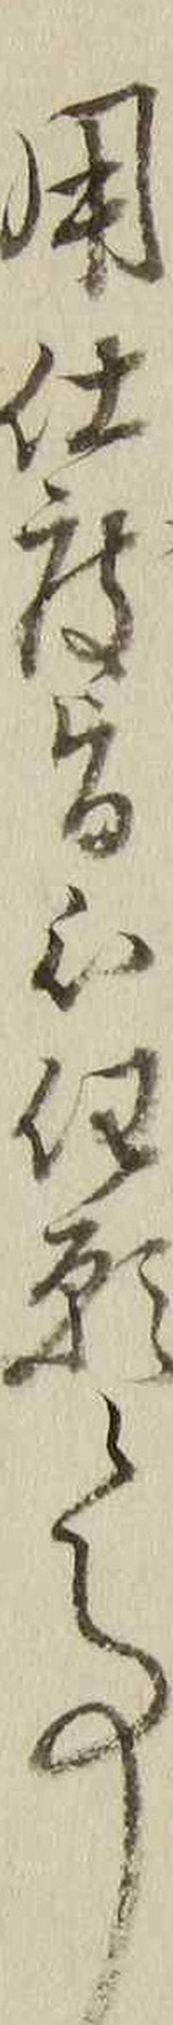用仕度旨被任願候事
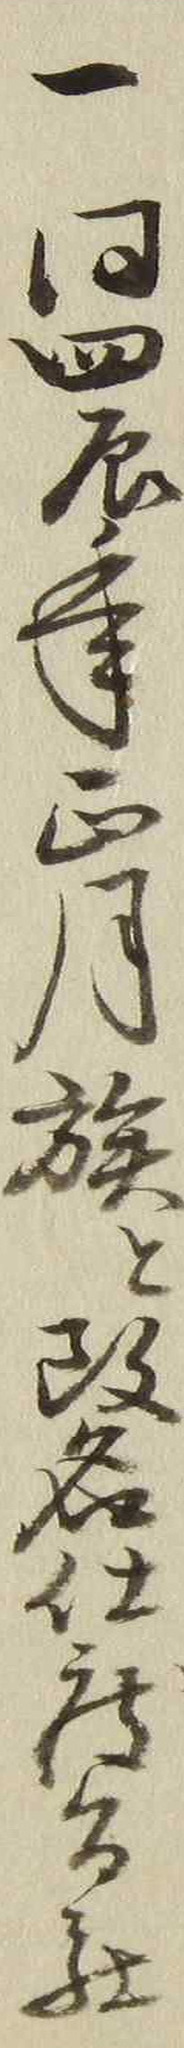一同四辰年正月族と改名仕度旨被
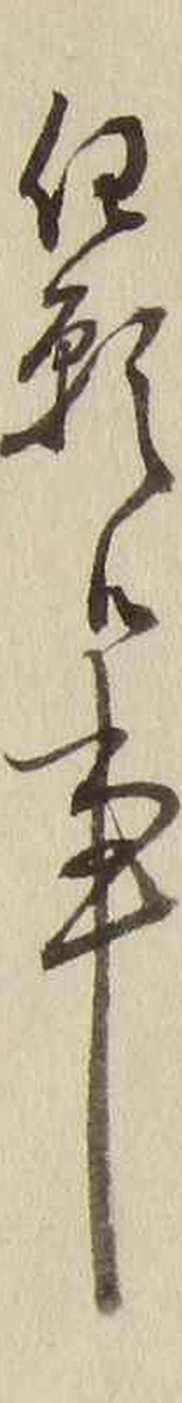任願候事
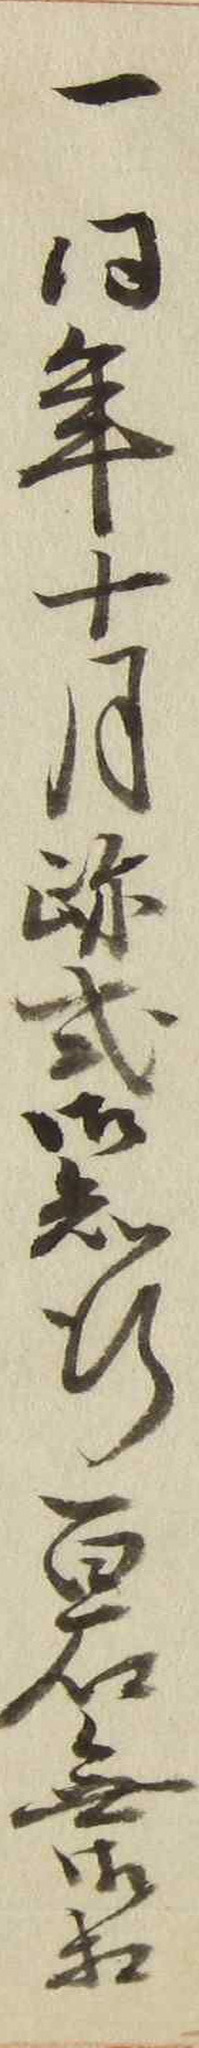一同年十月跡式御知行百石無御相
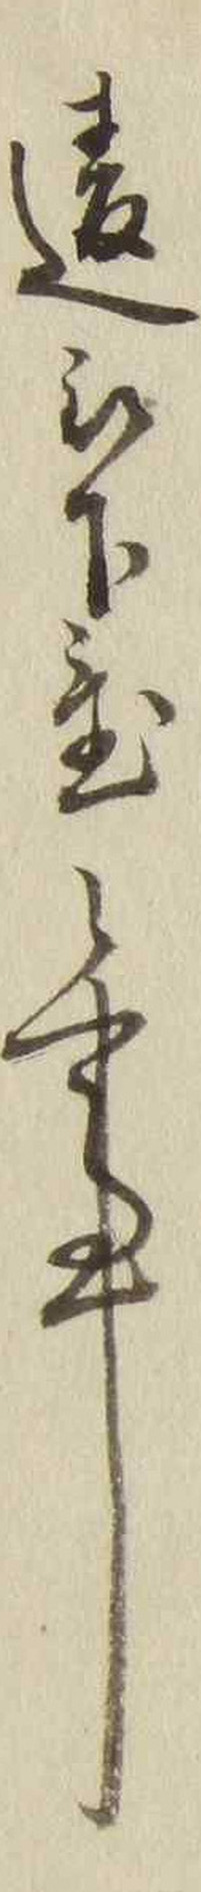違被下置候事

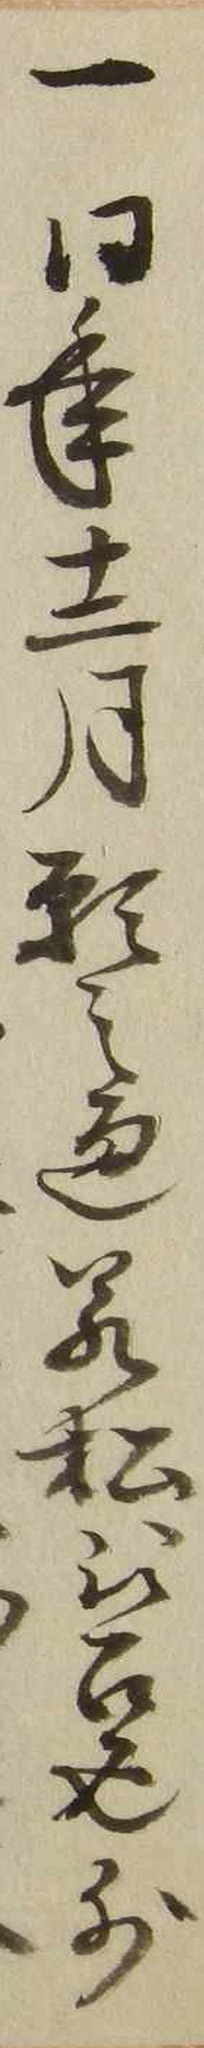一同年十二月願之通若松へ被召返外
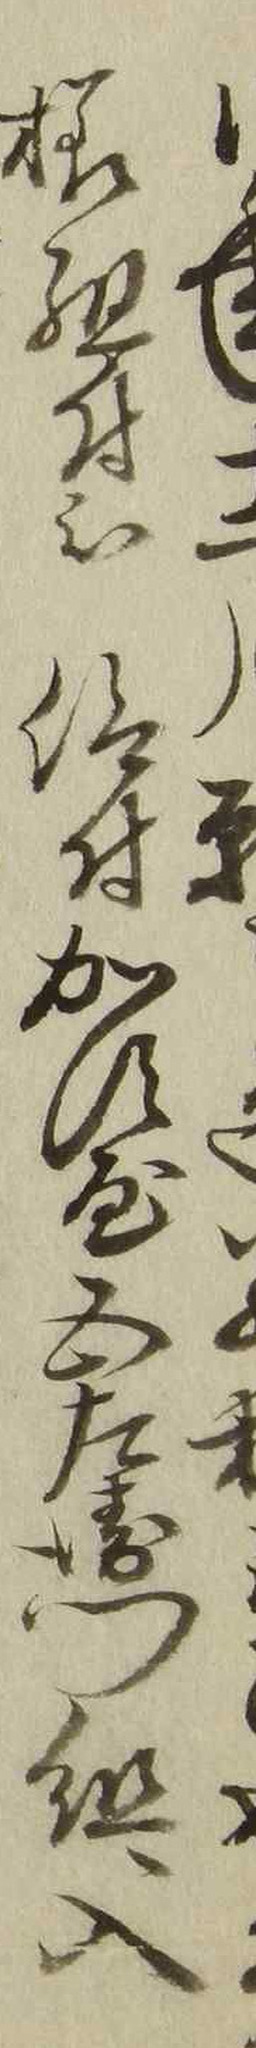様組付被仰付加須屋五左衛門組へ入
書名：諸士系譜　巻之53　に之部4
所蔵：会津若松市立会津図書館
